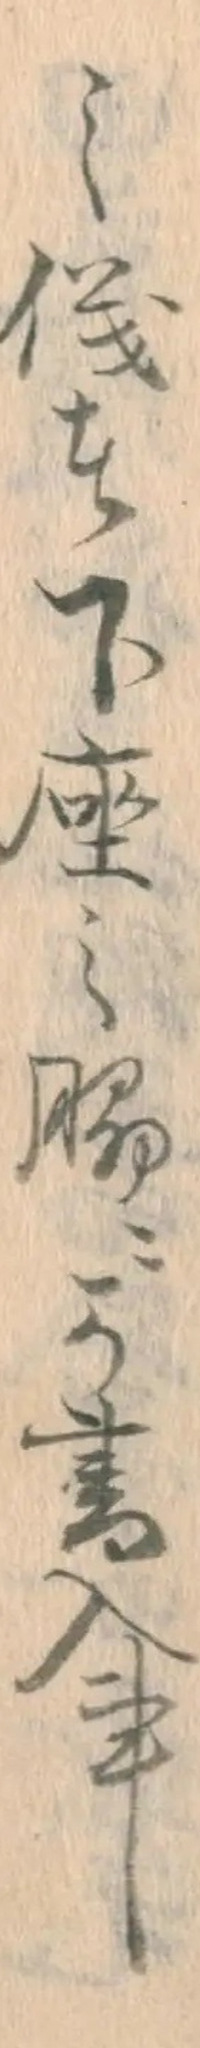之儀者下座之脇ニ可書入事
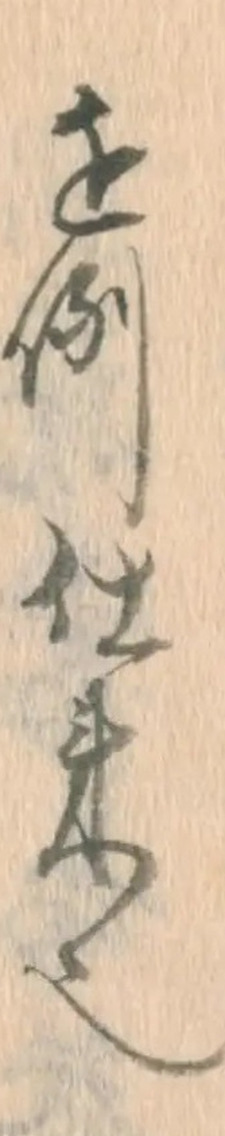近例仕来也
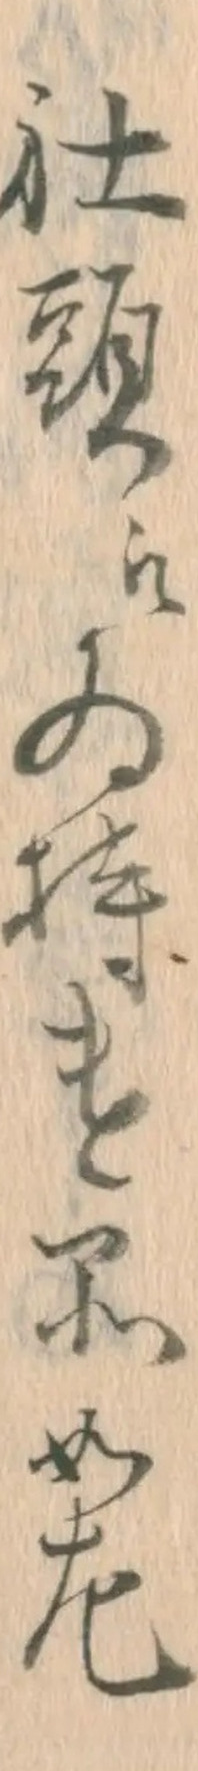社頭え為持遣品如左
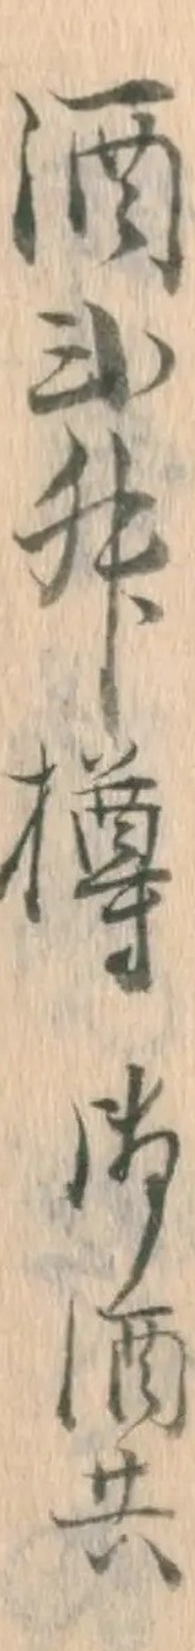酒弐升樽御酒共
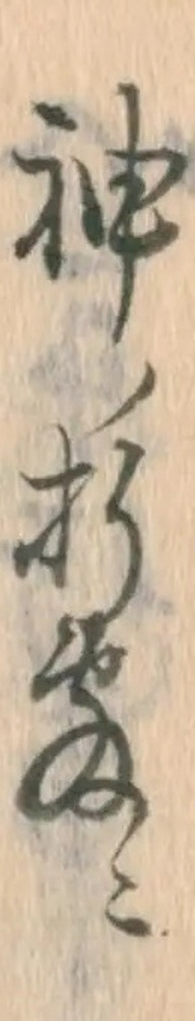神ノ折敷ニ
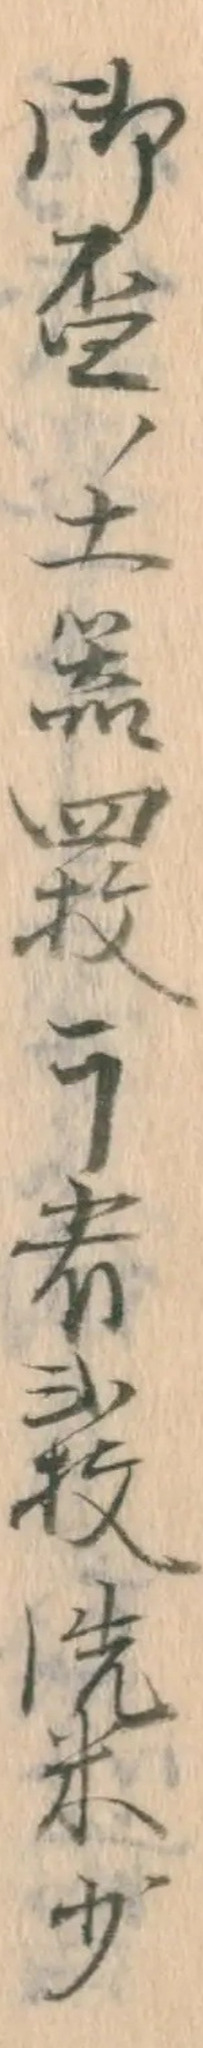御盃ノ土器四枚干肴弐枚洗米少
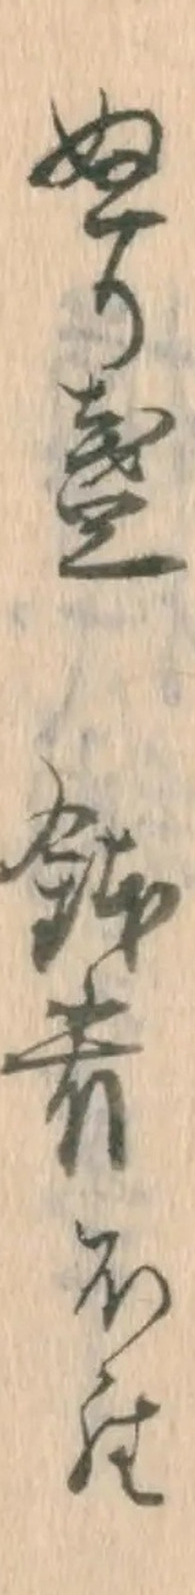ぬり盞鉢肴ほれ
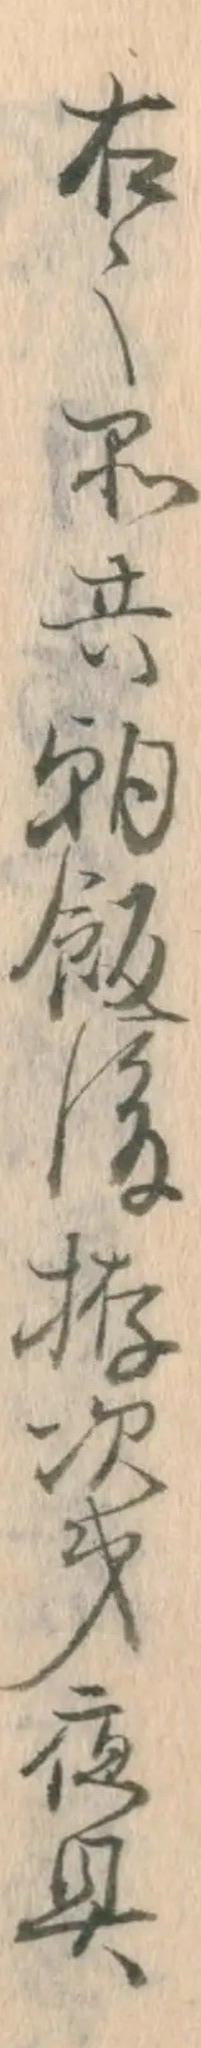右之品共朝飯後拵次第夜具
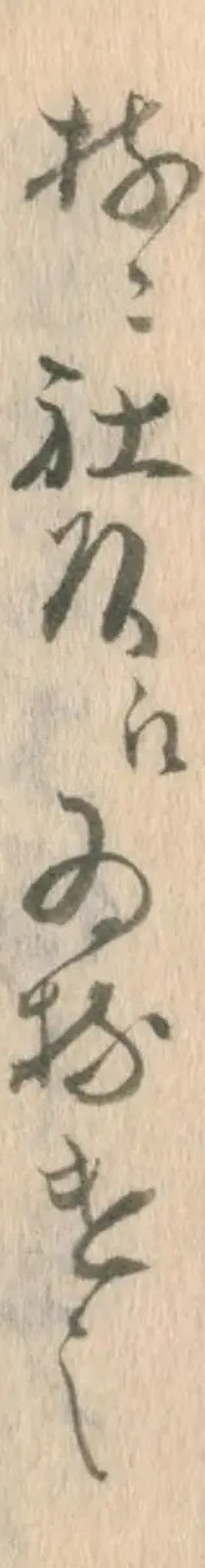拵ニ社頭え為持遣也
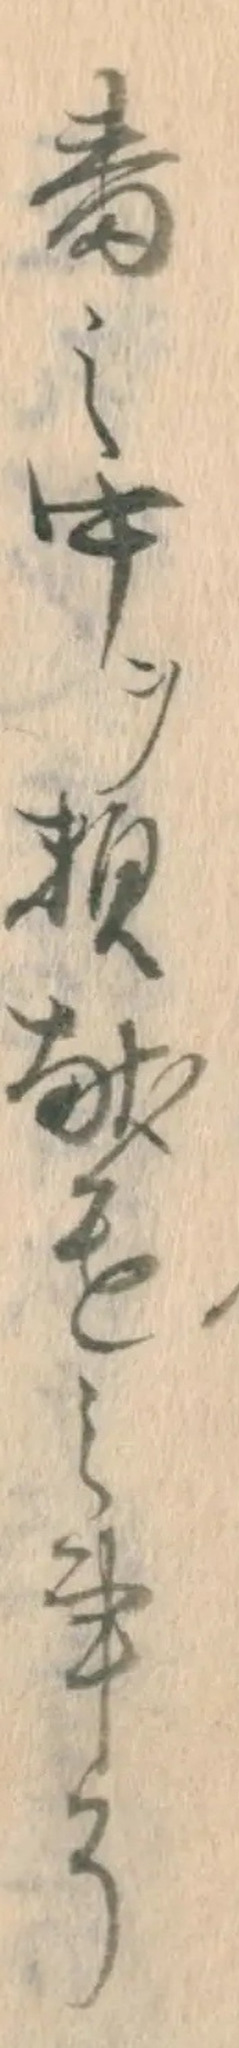番之中ヲ頼献遣之事了
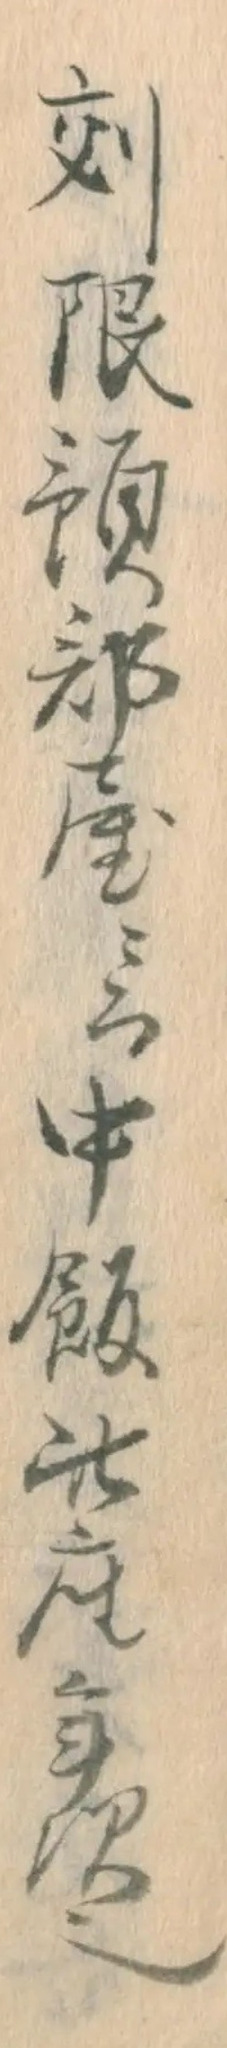刻限預部屋ニ而中飯此座年次也

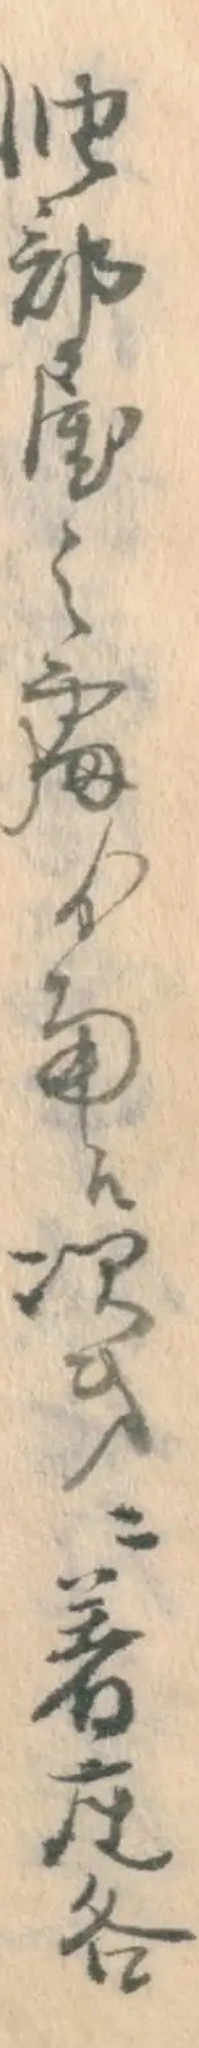油部屋之筋ゟ南え次第ニ着座各
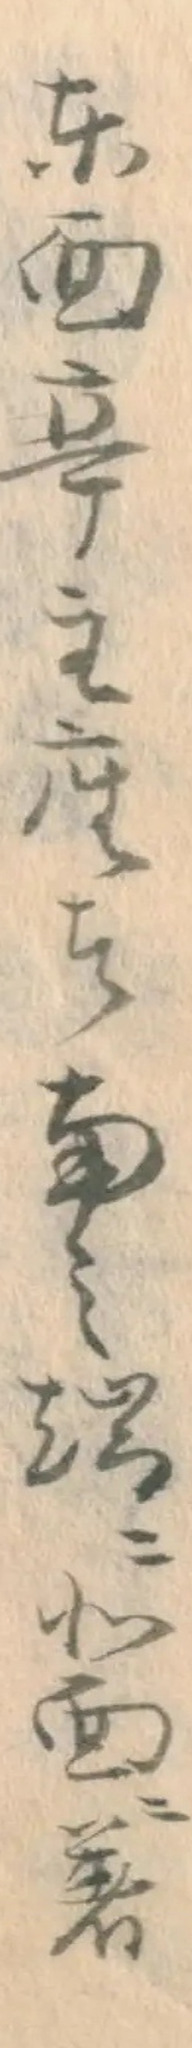東西亭主座者南之端ニ北面ニ着
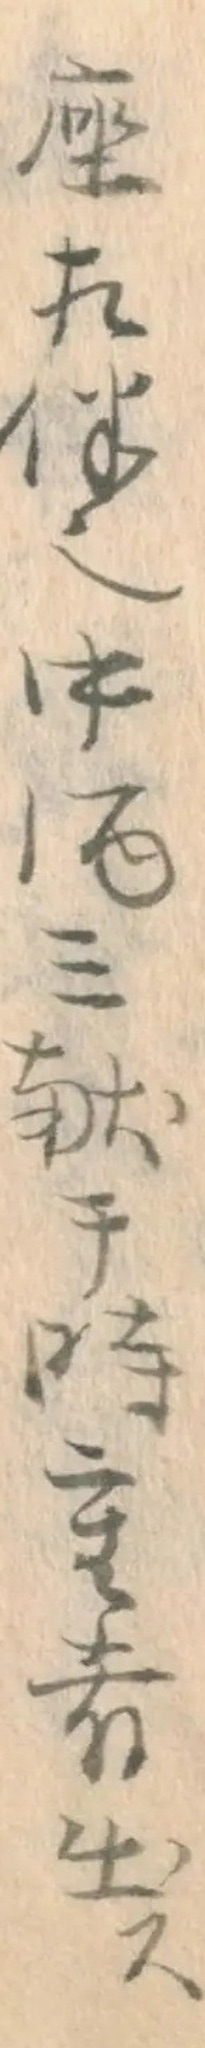座相伴也中酒三献于時重肴出ス
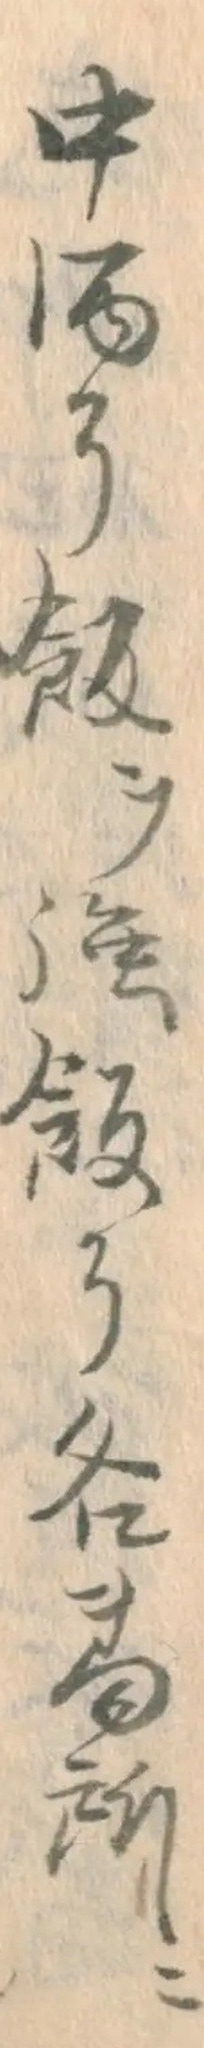中酒了飯を強飯了各番所に
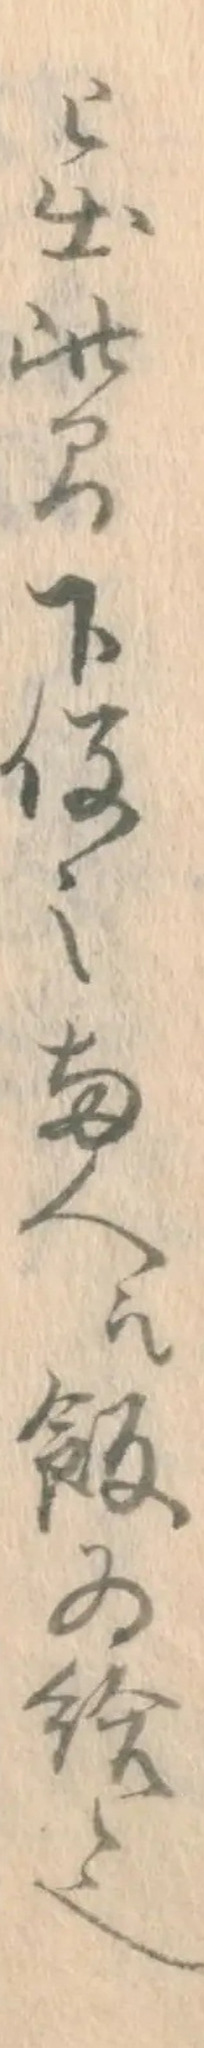被出此間下役之両人え飯為結候也
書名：賀茂社記録. 第81冊
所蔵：国立国会図書館 National Diet Library, JAPAN
